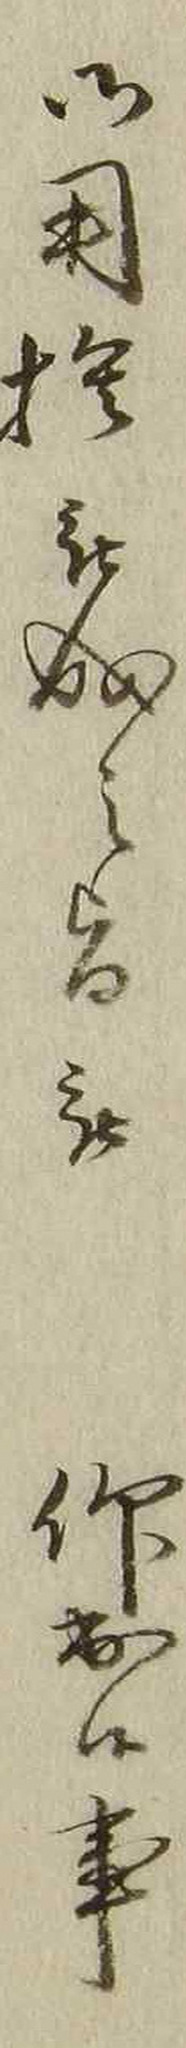御用捨被成之旨被仰出候事
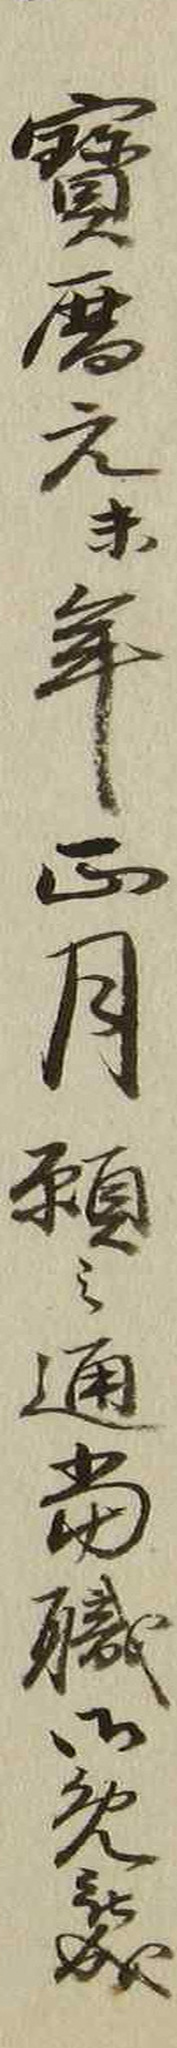一宝暦元未年正月願之通当職御免被成
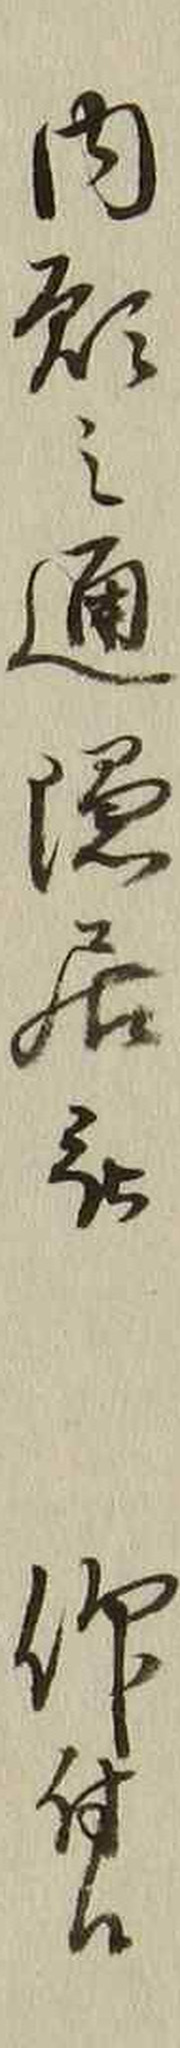内願之通隠居被仰付候
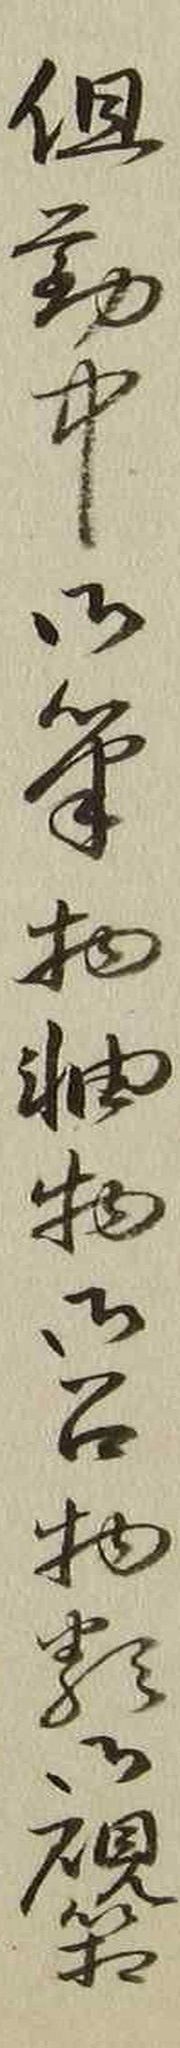但勤中御筆物軸物御召物類御硯箱
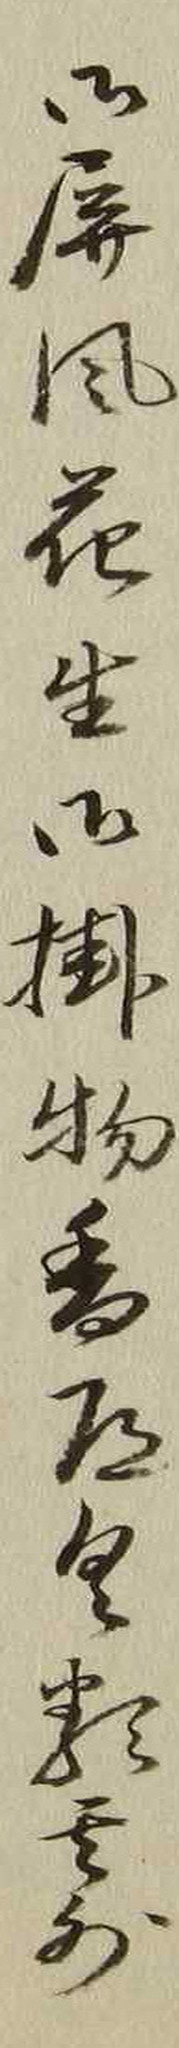御屏風花生御掛物香道具類其外
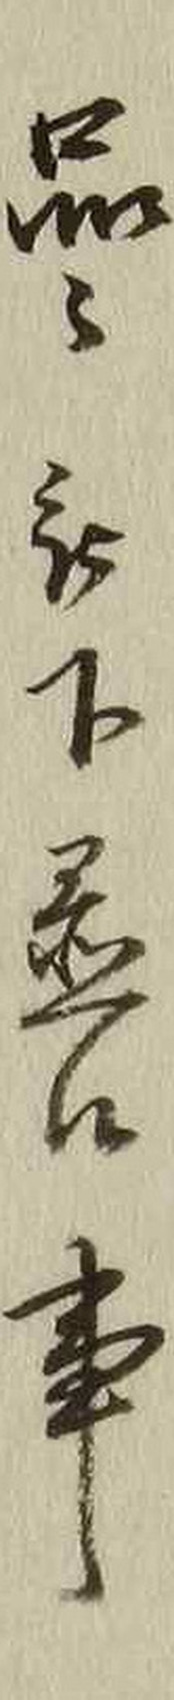品々被下置候事
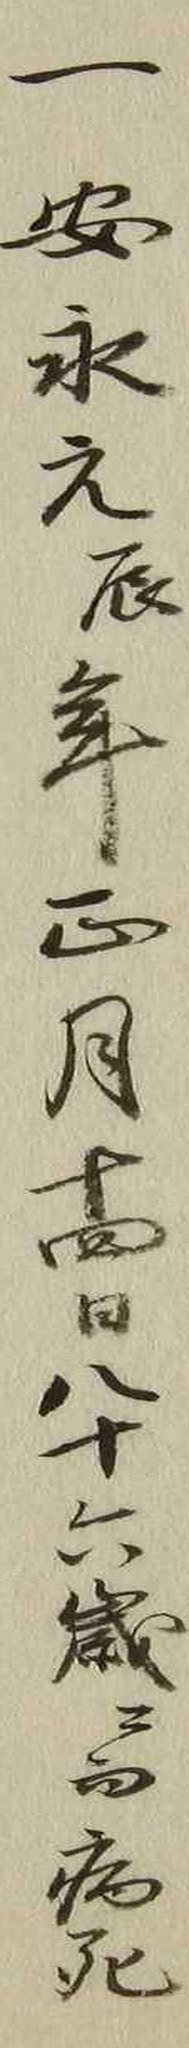一安永元辰年正月十四日八十六歳に而病死
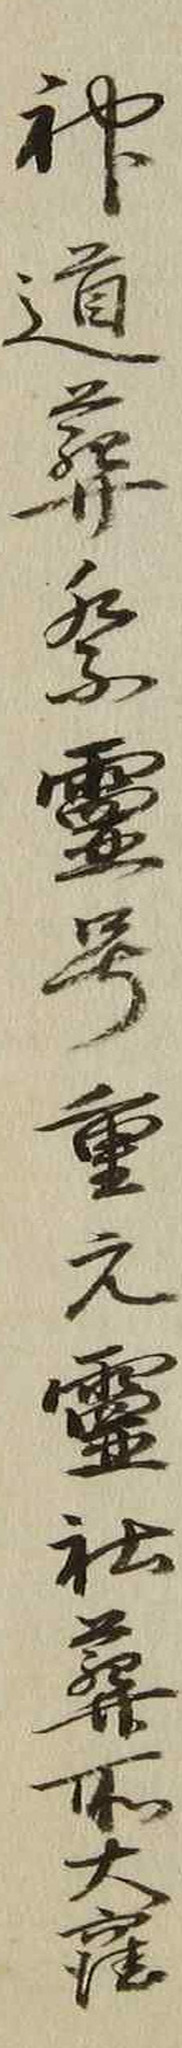神道葬祭霊号重元霊社葬所大窪
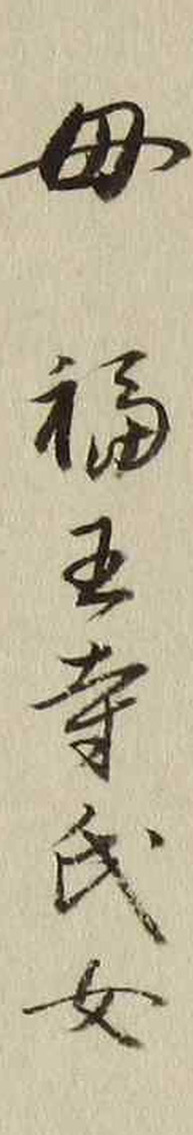母福王寺氏女
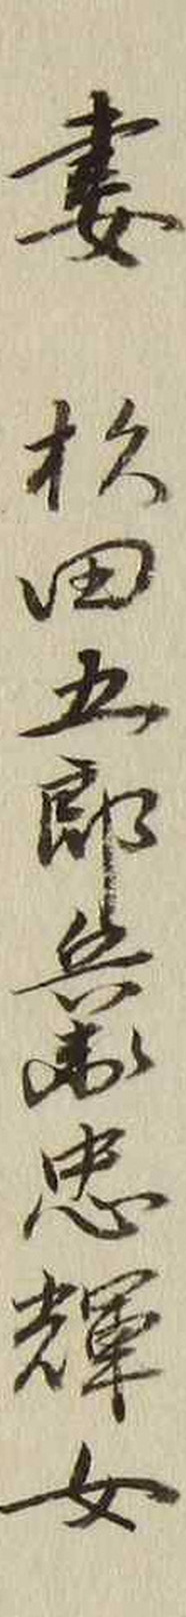妻杉田五郎兵衛景忠輝女
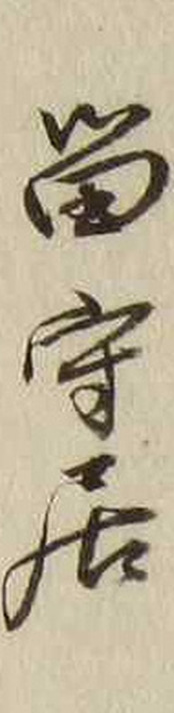留守居

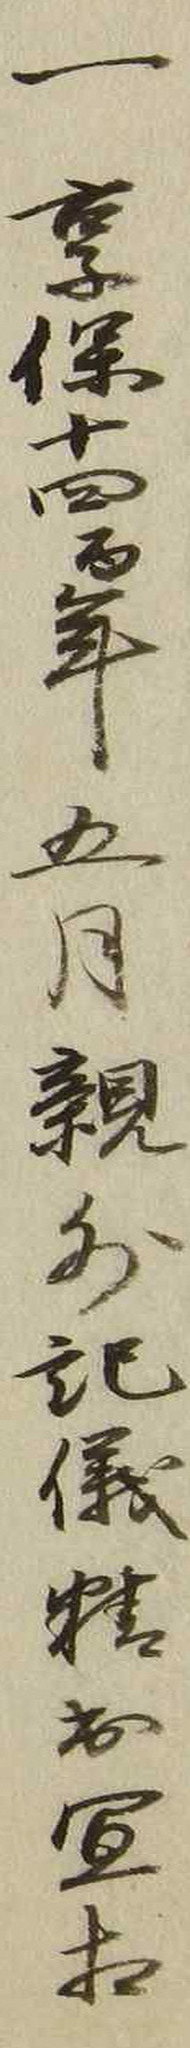一享保十四酉年五月親外記儀精出宜相
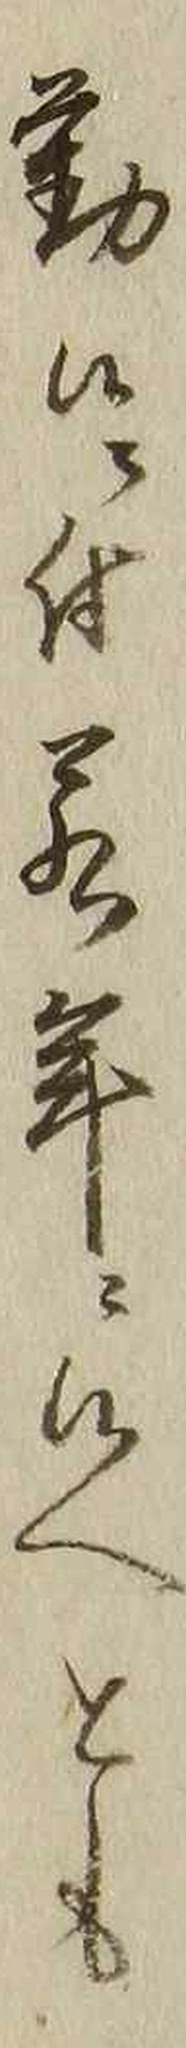勤候に付若年に候へとも
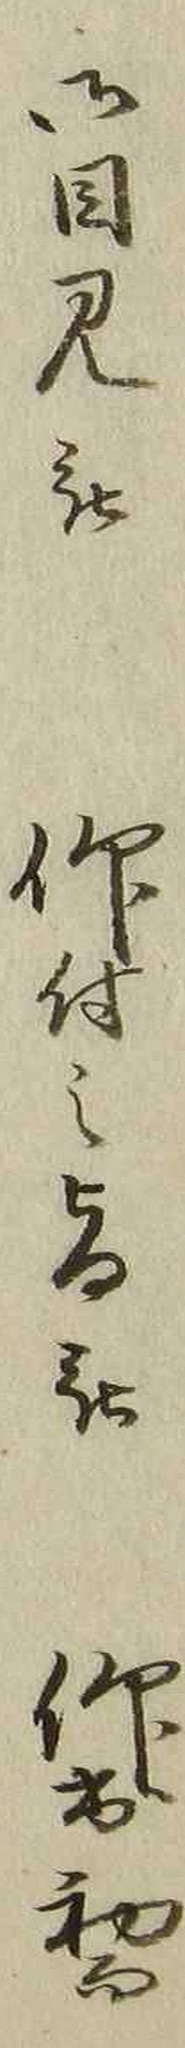御目見被仰付之旨被仰出初而
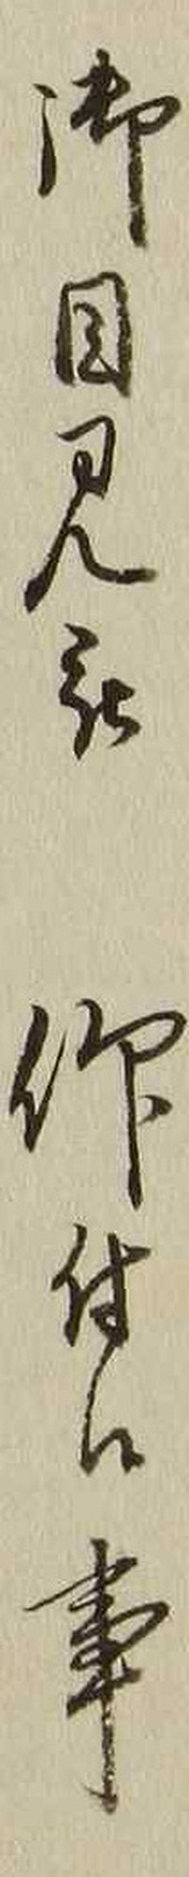之御目見被仰付候事
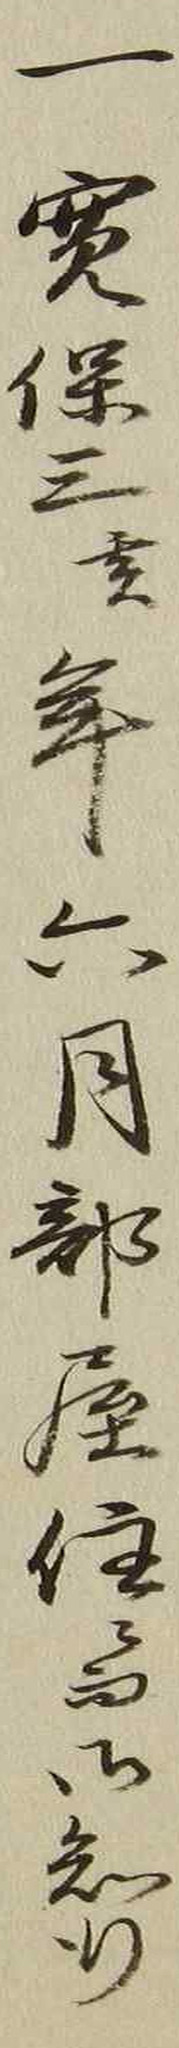一寛保三亥年六月部屋住に而御知行
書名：諸士系譜　巻之133　た之部9
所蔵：会津若松市立会津図書館
